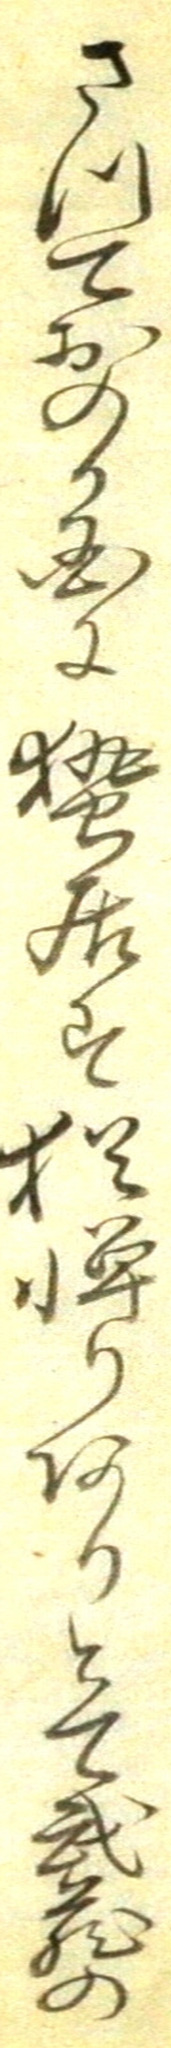さつておのか国に蟄居す猶憚りありとて武蔵の
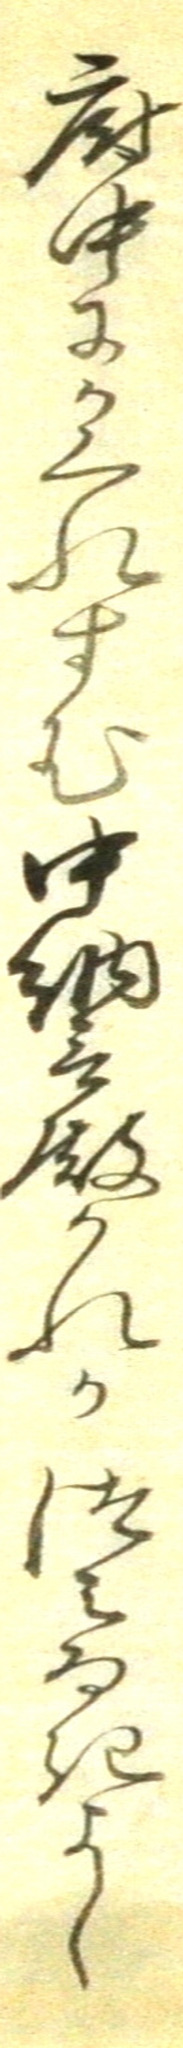府中にかくれすむ中納言殿かれかつみなきよし
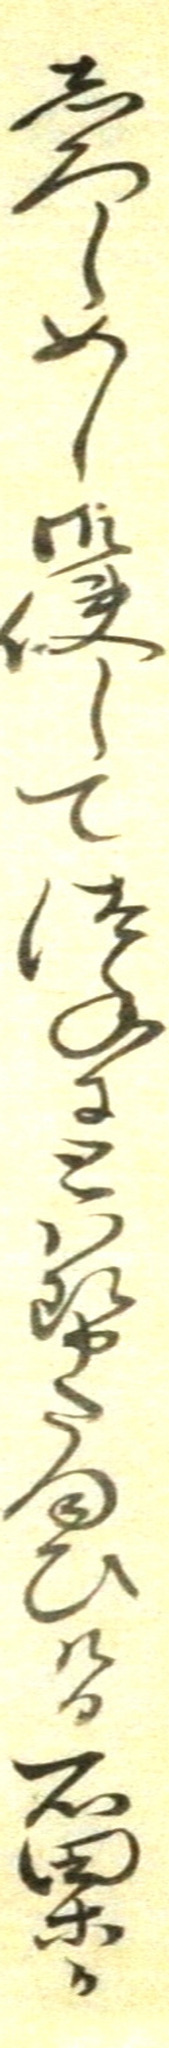しろしめし御使してつねにとはせたまひける石田等か
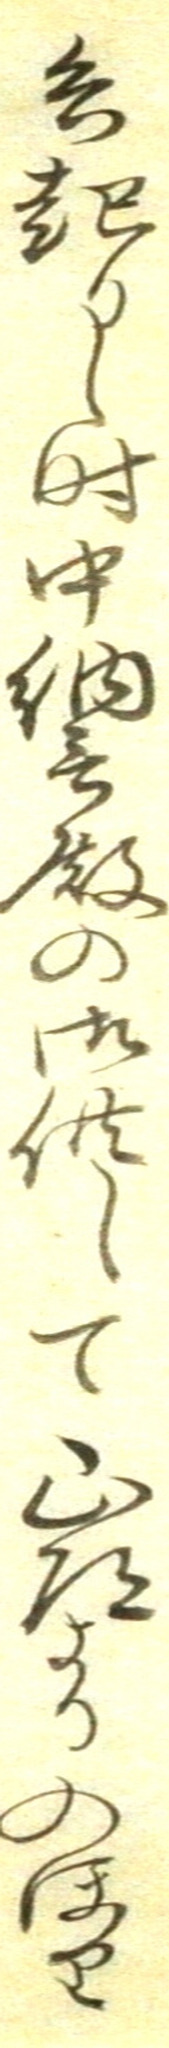兵起りし時中納言殿の御供して山道よりのほり
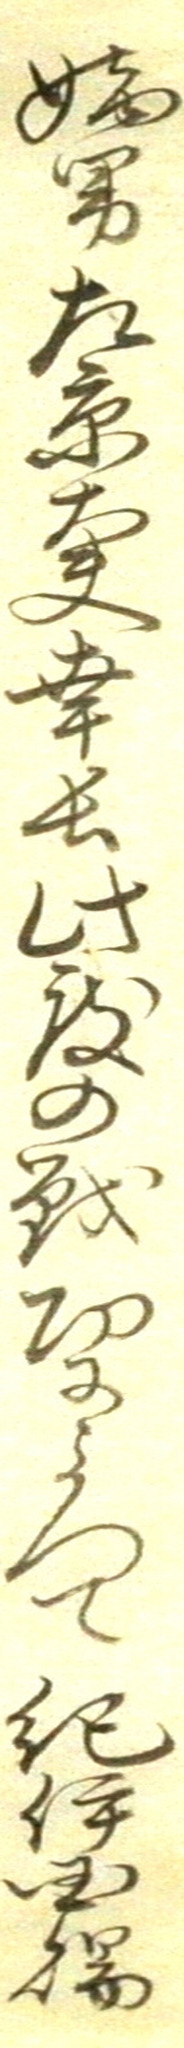嫡男左京大夫幸長此度の戦功によつて紀伊国賜
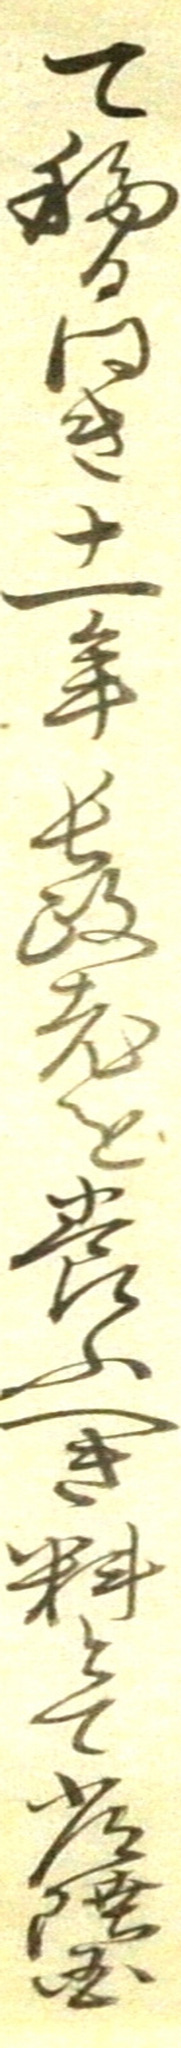て移る同き十一年長政老を養ふへき料とて常陸国
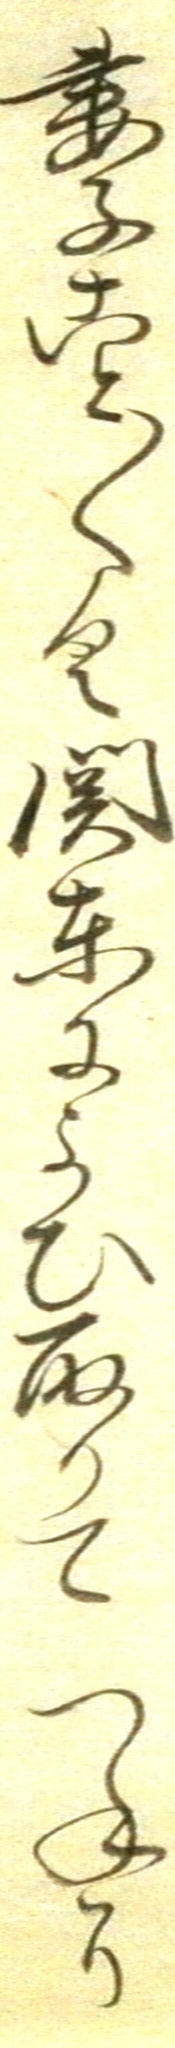妻子こと〳〵く関東によひ取てつねに
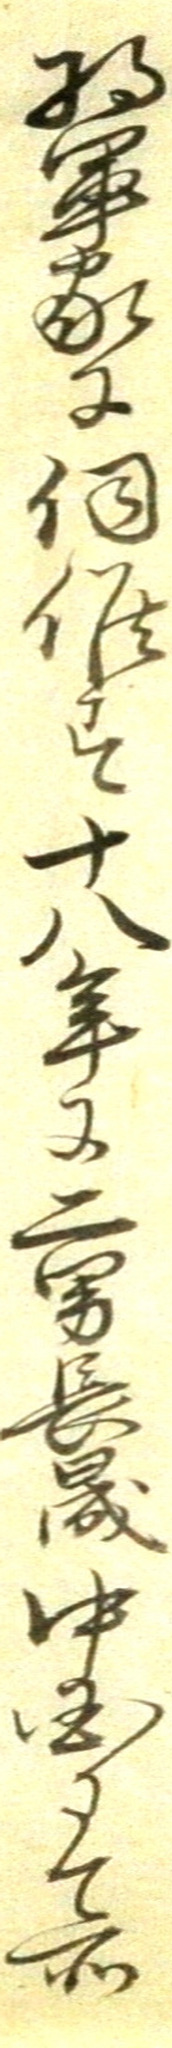将軍家に伺候す十八年に二男長晟中国にて所
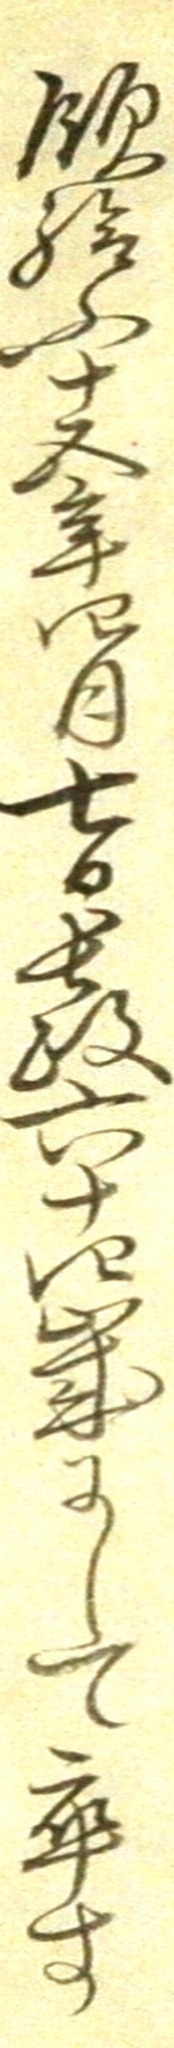領給ふ十五年四月七日長政六十四歳にして卒す
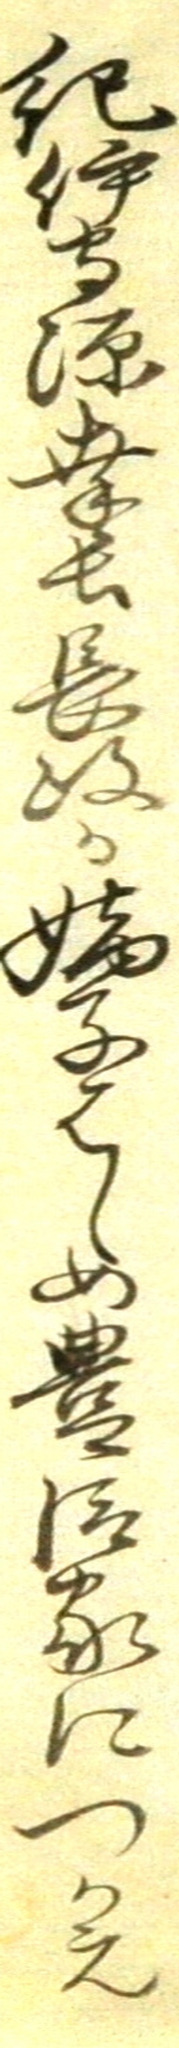紀伊守源幸長長政か嫡子はしめ豊臣家につかえ
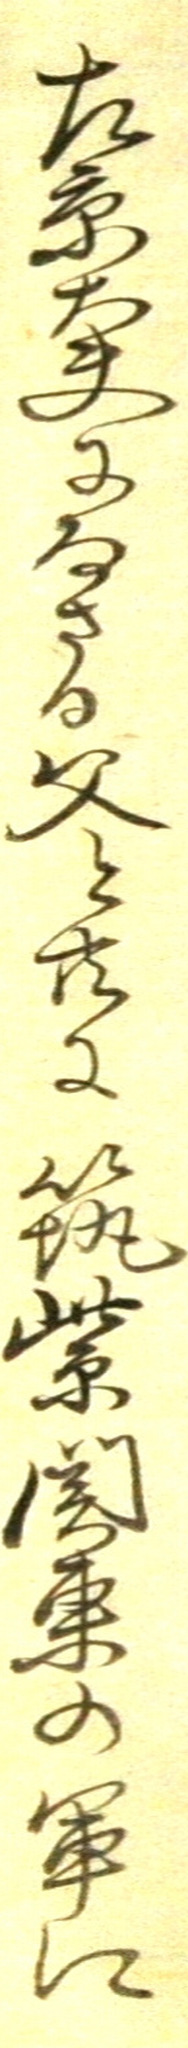左京大夫になさる父と共に筑紫関東の軍に

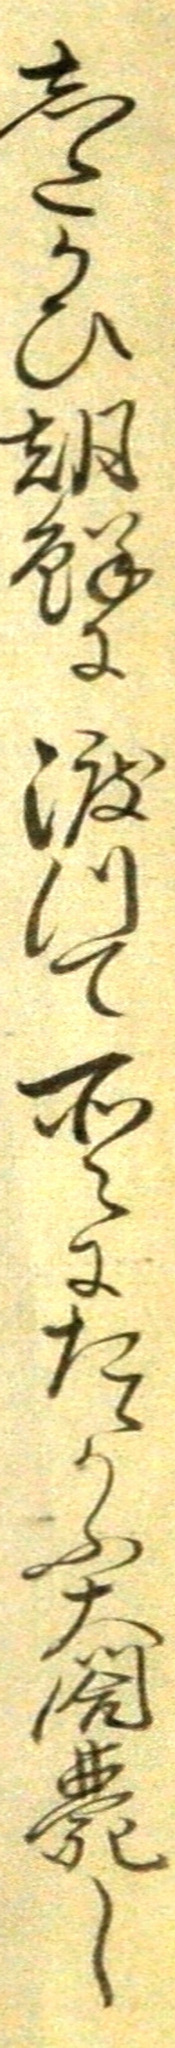したかひ朝鮮に渡つて所々にたゝかふ太閤薨し
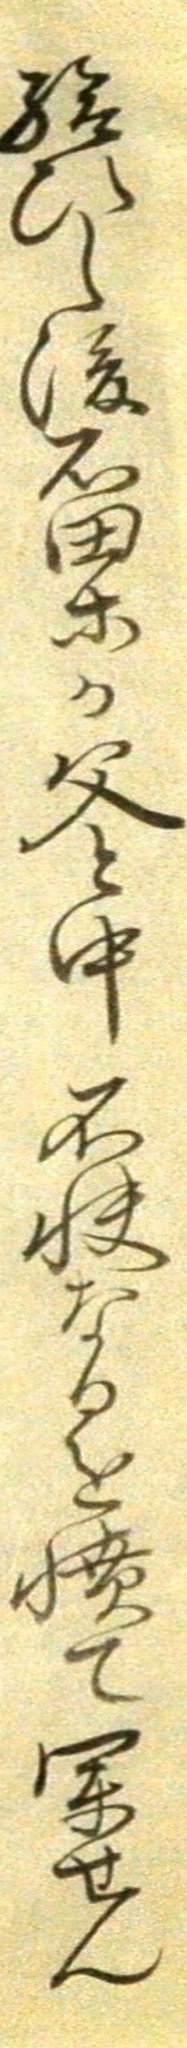給ひし後石田等か父と中不快なるを憤て軍せん
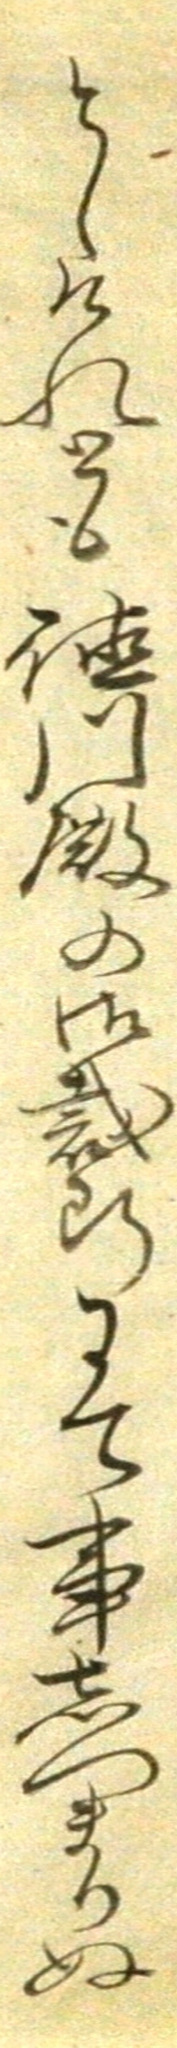としけれとも徳川殿の御裁断にて事しつまりぬ
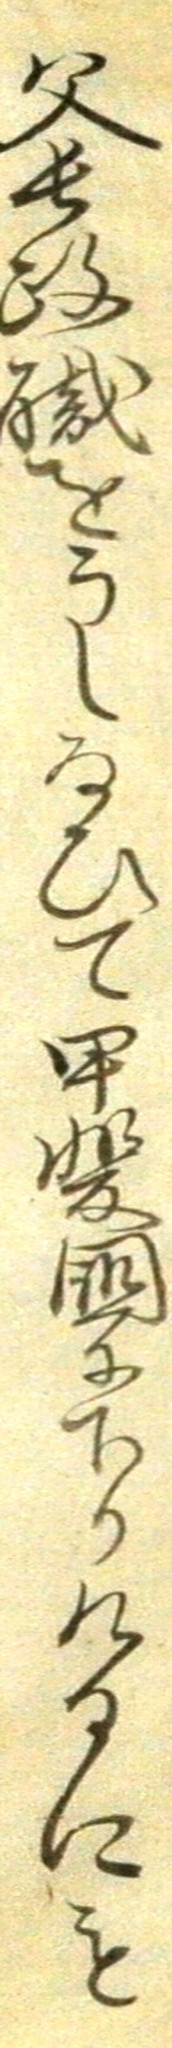父長政職をうしなひて甲斐国に下りけるにも
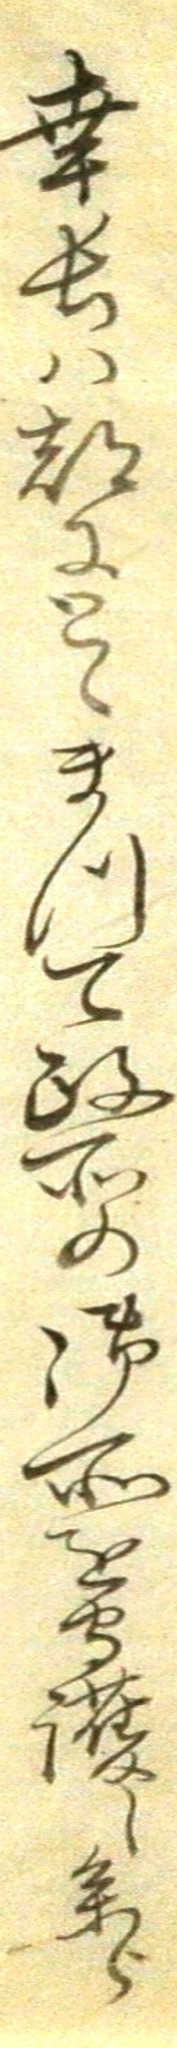幸長は都にとゝまつて政所の御所を守護し参ら
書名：藩翰譜（七・上）
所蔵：伊那市立高遠町図書館・合同会社AMANE
